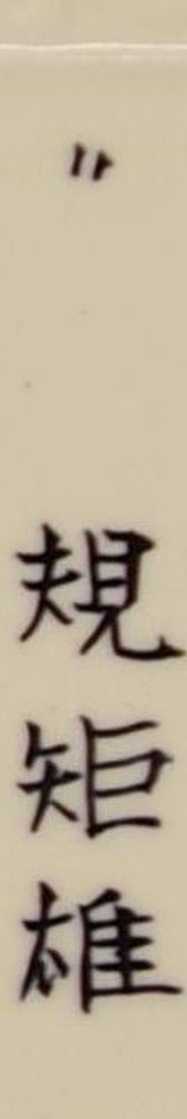規矩雄
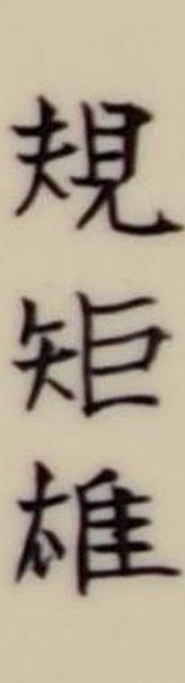規矩雄
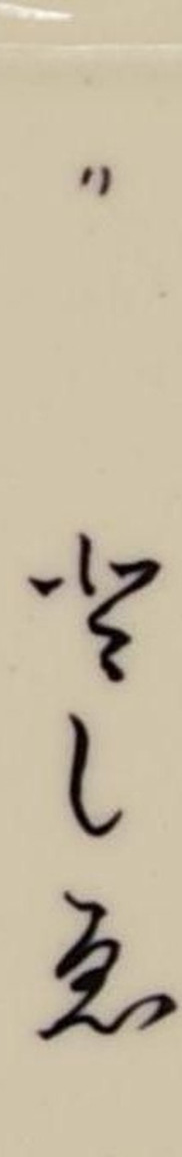としゑ
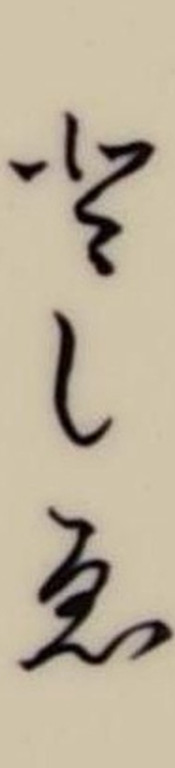としゑ
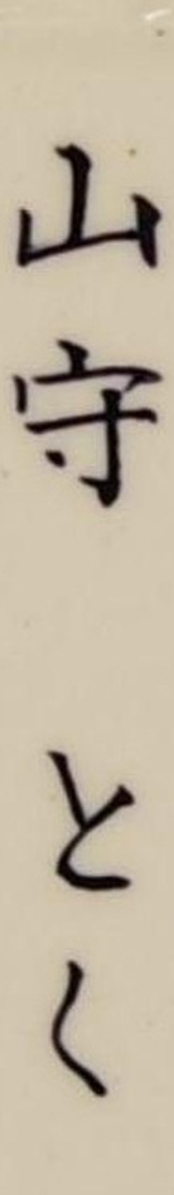山守とく
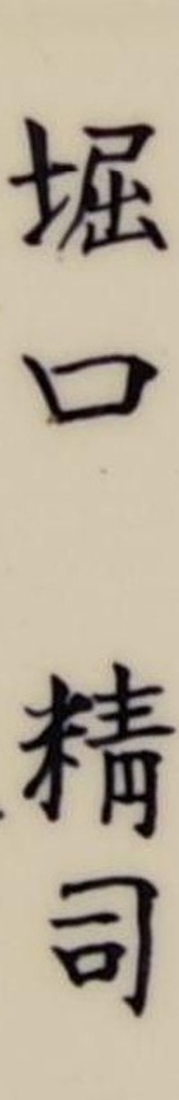堀口精司
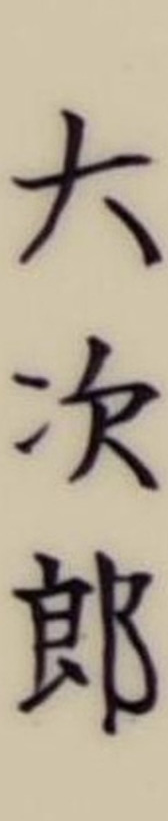大次郎
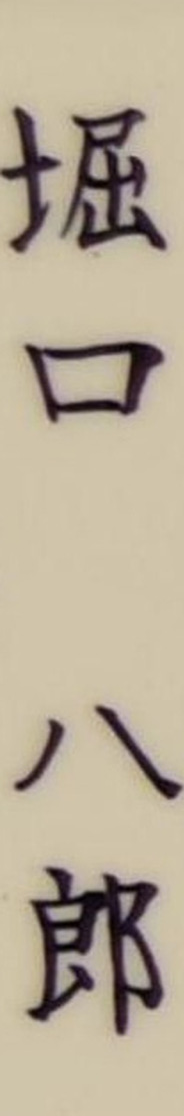堀口八郎
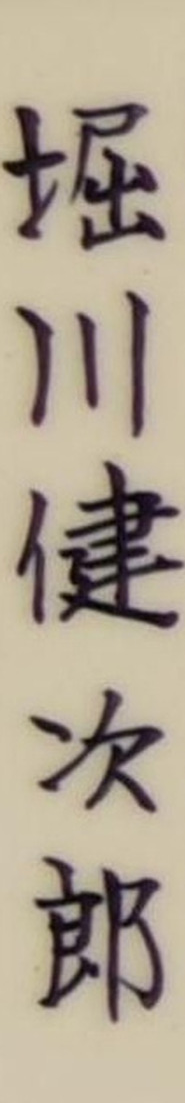堀川健次郎

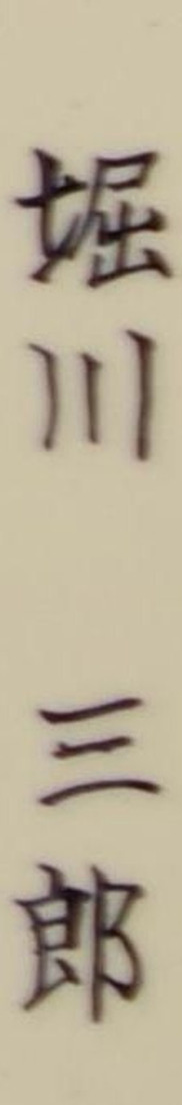堀川三郎
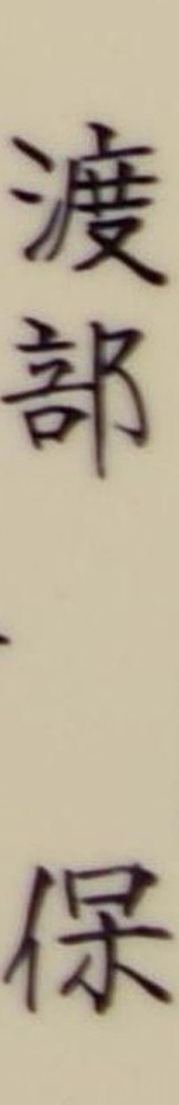渡部保
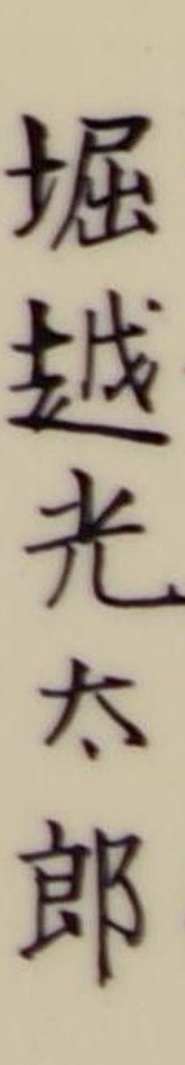堀越光太郎
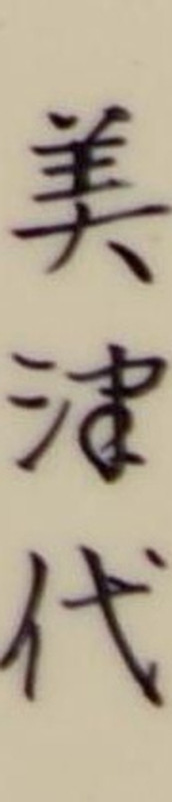美津代
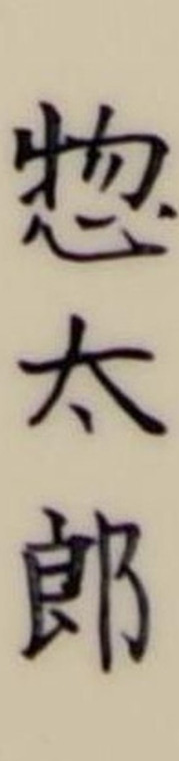惣太郎
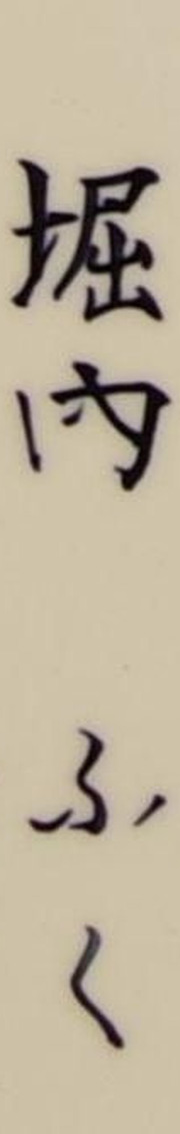堀内ふく
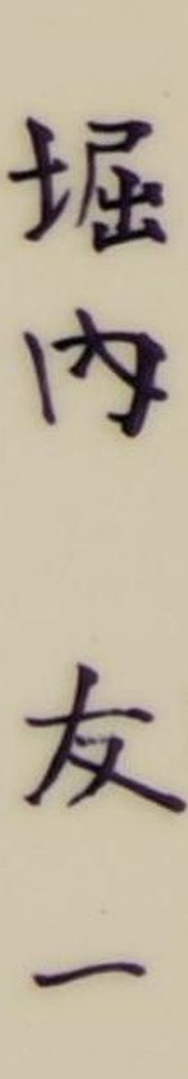堀内友一
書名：A~D
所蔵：koyasan kongobuji
